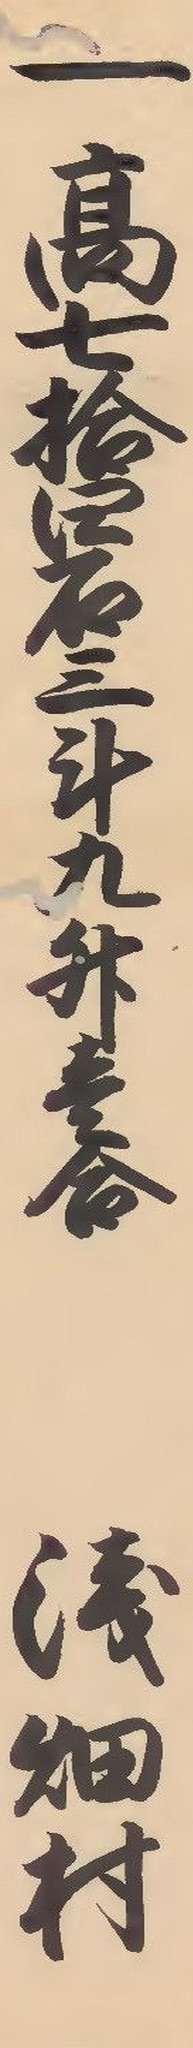一高七拾四石三斗九升壱合浅畑村

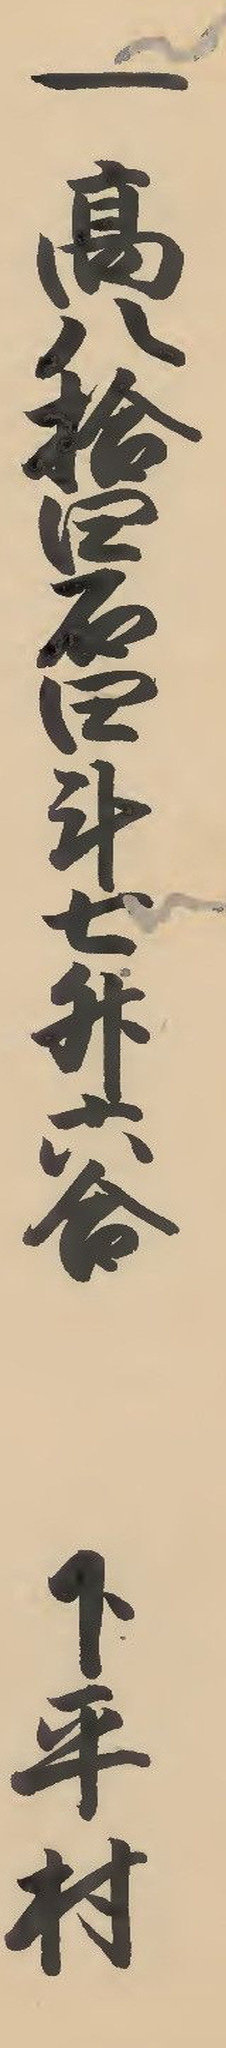一高八拾四石四斗七升六合下平村
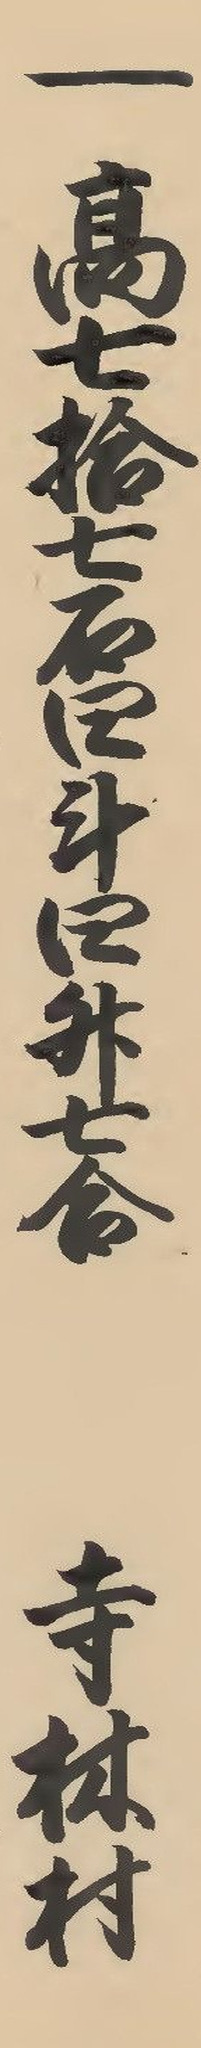一高七拾七石四斗四升七合寺林村
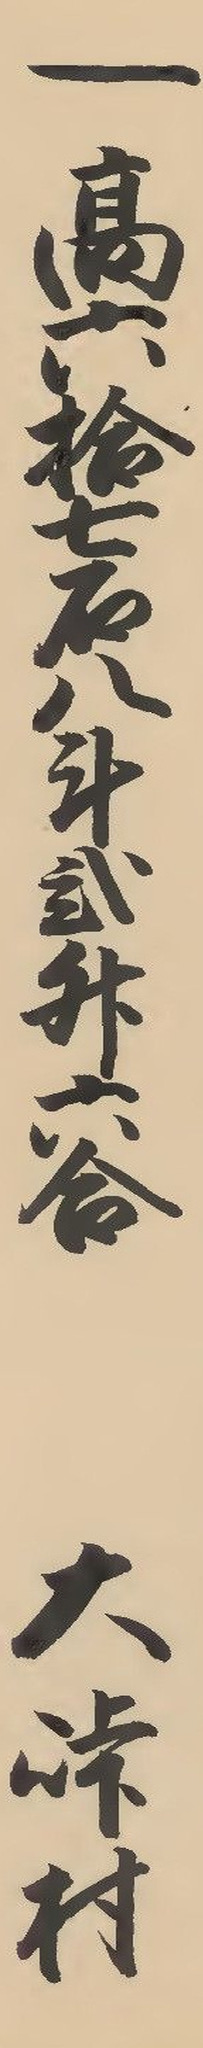一高六拾七石八斗弐升六合大峠村
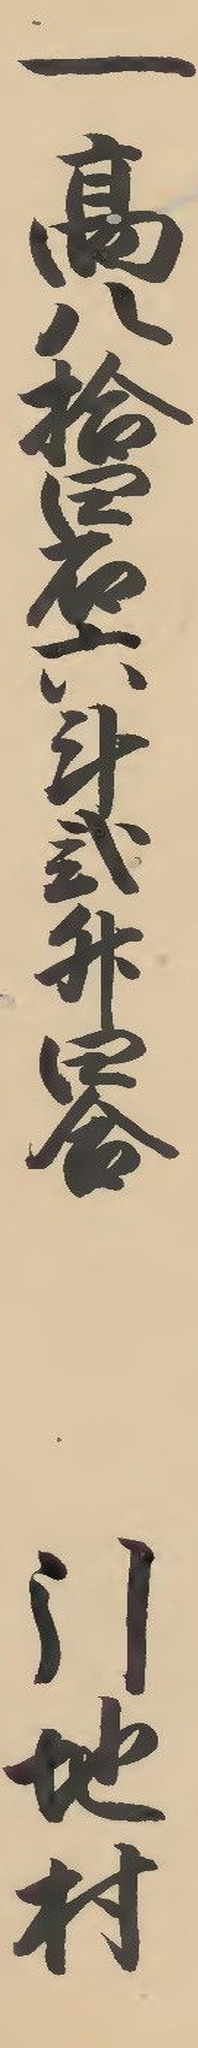一高八拾四石六斗弐升四合引地村
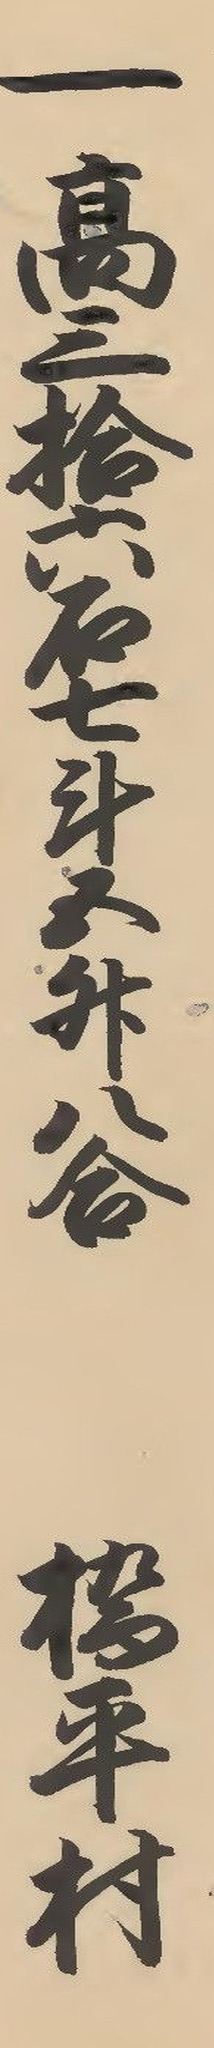一高三拾六石七斗五升八合橋平村
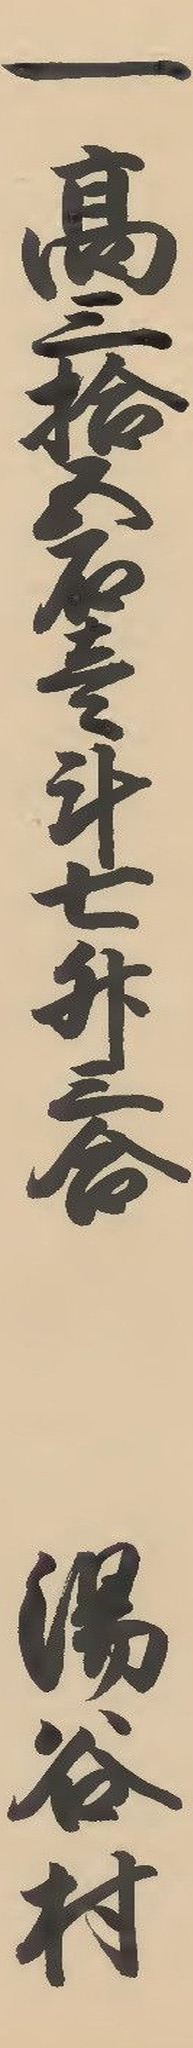一高三拾五石壱斗七升三合湯谷村
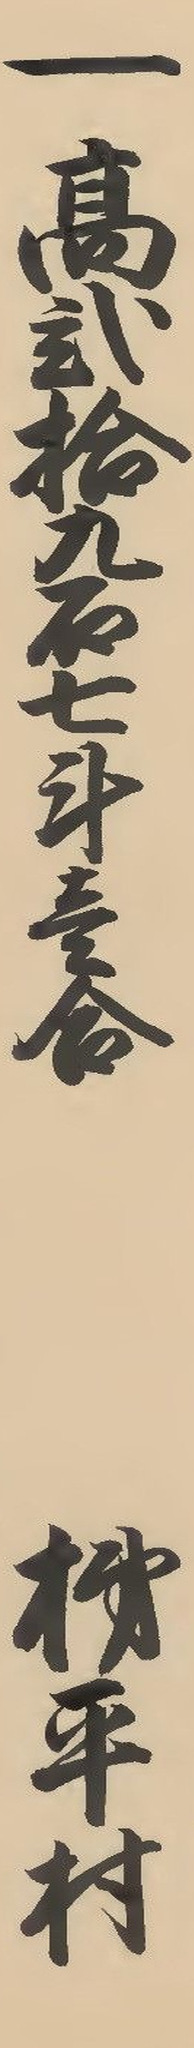一高弐拾九石七斗壱合柿平村
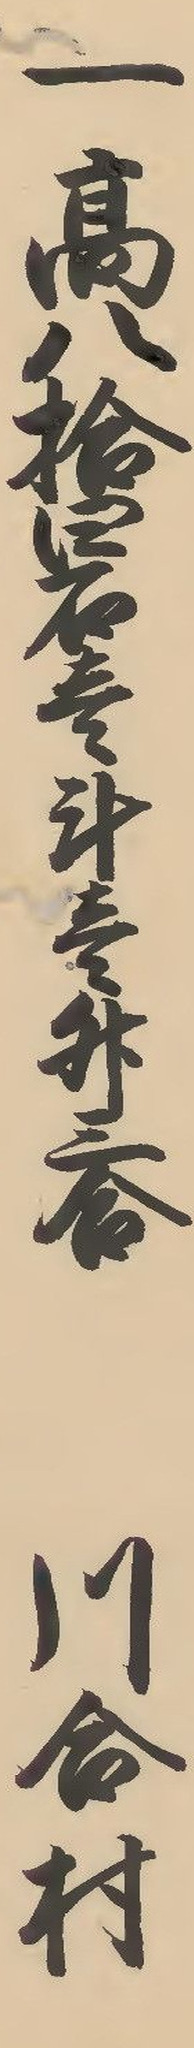一高八拾四石壱斗壱升三合川合村

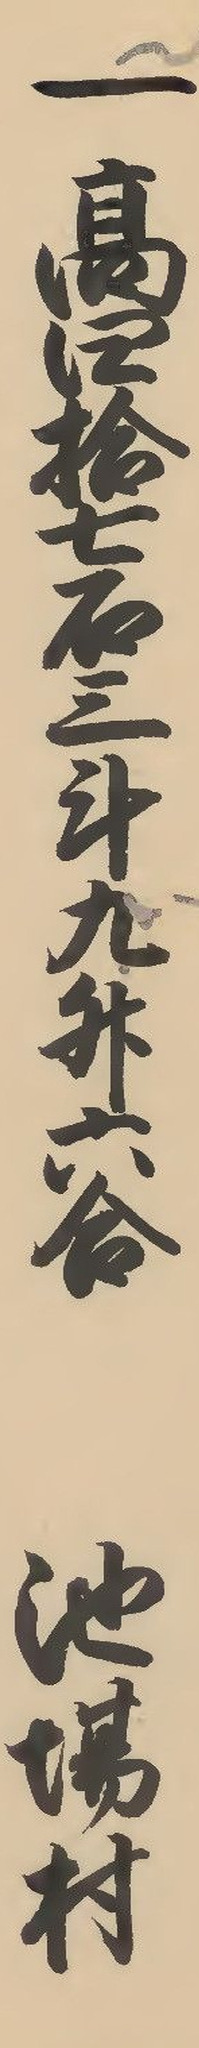一高四拾七石三斗九升六合池場村
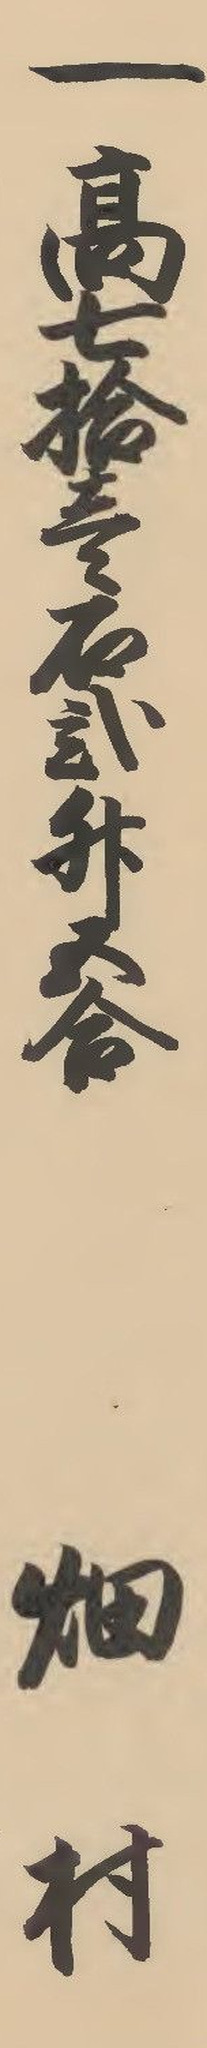一高七拾壱石弐升五合畑村
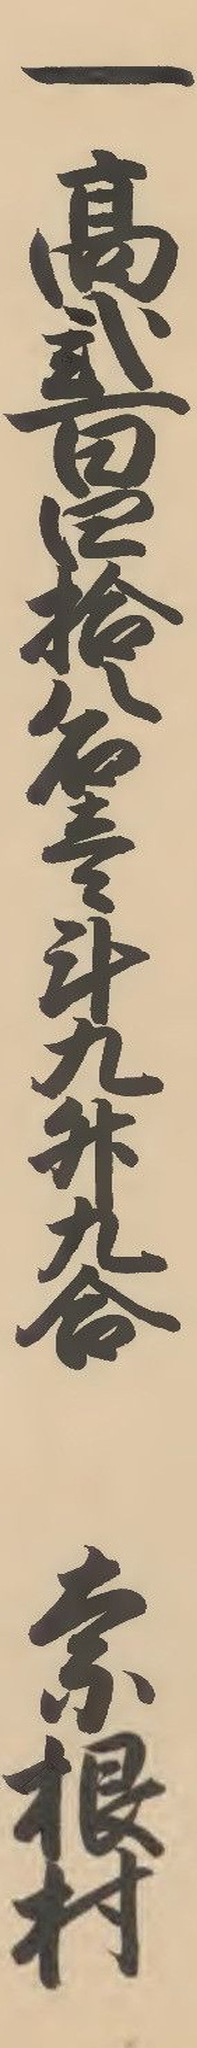一高弐百四拾八石壱斗九升九合奈根村
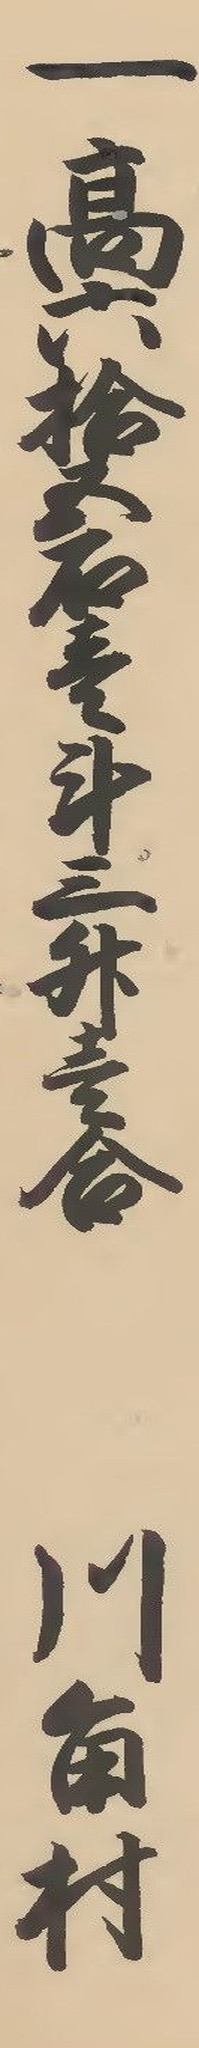一高六拾五石壱斗三升壱合川角村
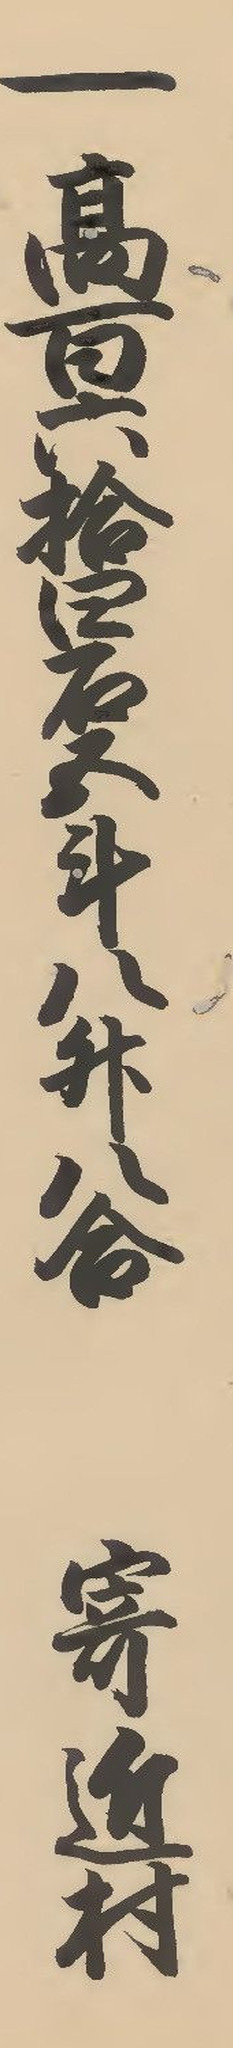一高百六拾四石五斗八升八合寄近村
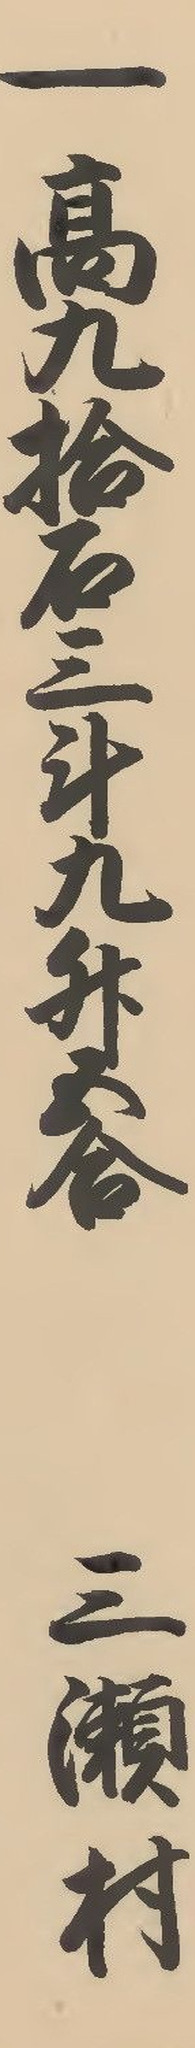一高九拾石三斗九升五合三瀬村
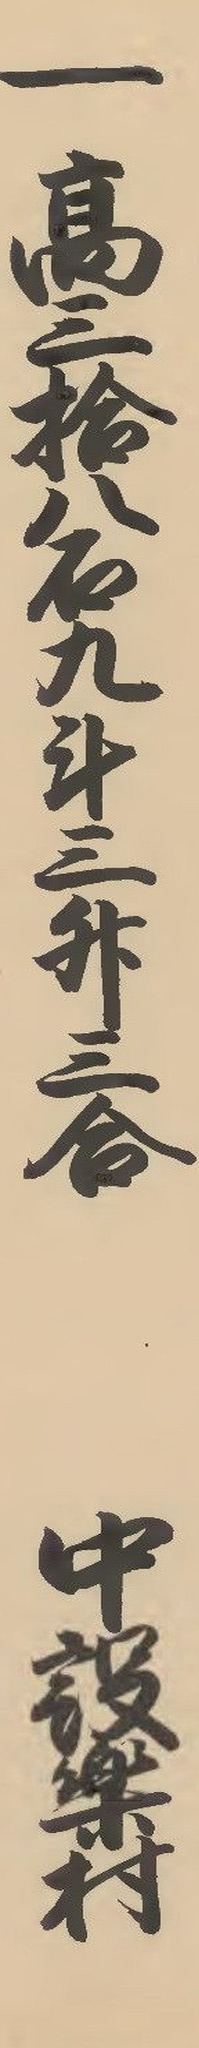一高三拾八石九斗三升三合中設楽村
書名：三河国郷帳
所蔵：国立公文書館 National Archives of Japan
